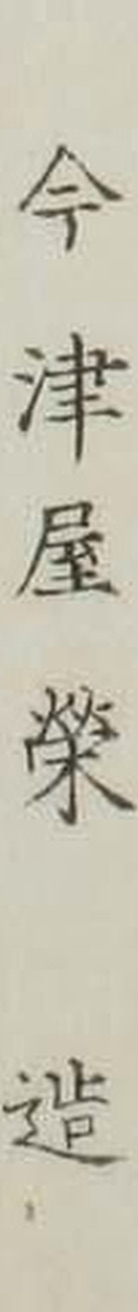今津屋榮造
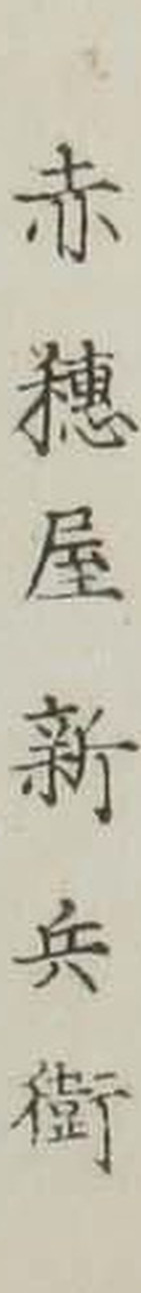赤穂屋新兵衛
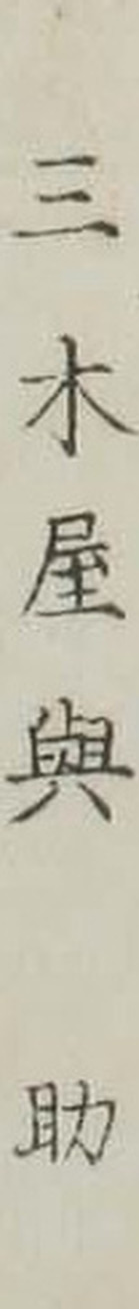三木屋與助
